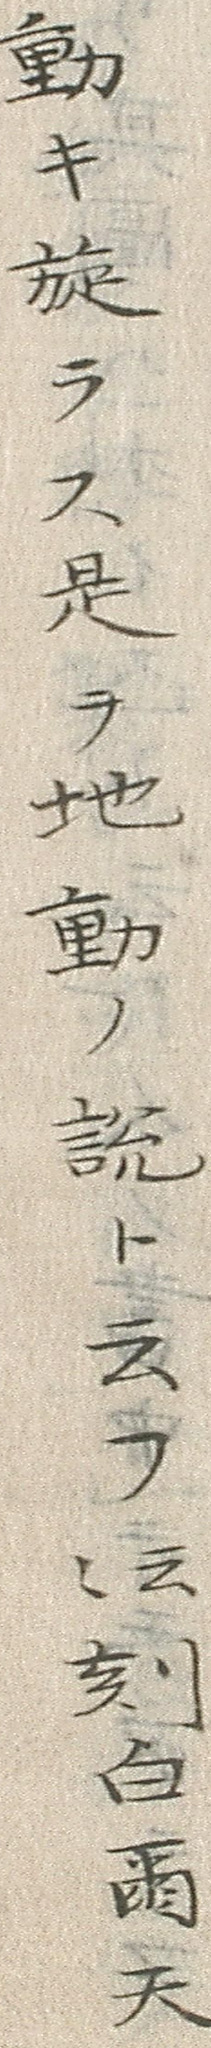動キ旋ラス是ヲ地動ノ説ト云フ云〻刻白爾天
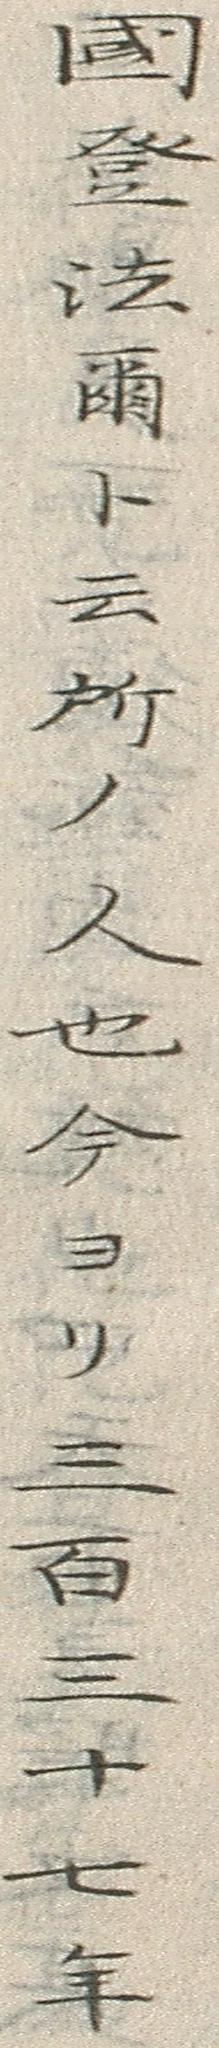国登法爾ト云所ノ人也今ヨリ三百三十七年
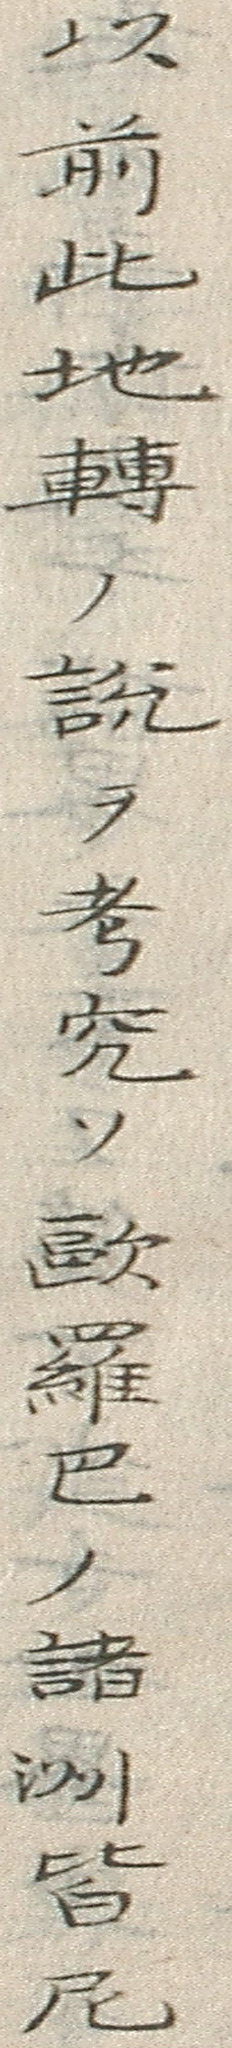以前此地転ノ説ヲ考究ソ欧羅巴ノ諸洲皆尼
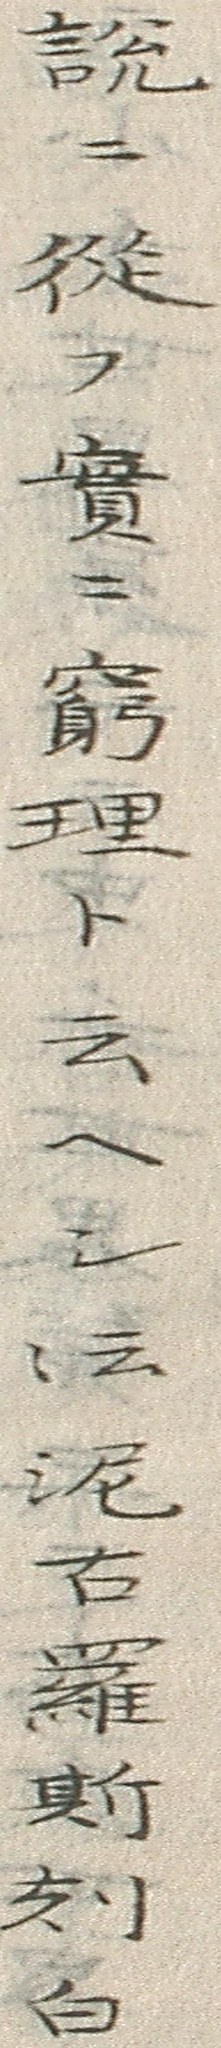説ニ従フ実ニ窮理ト云ヘシ云〻泥古羅斯刻白
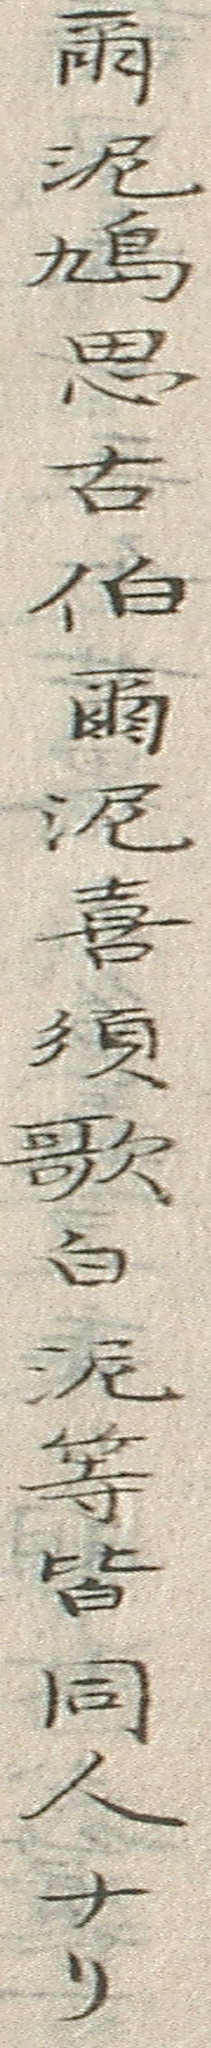爾泥鳩思古伯爾泥喜須歌白泥等皆同人ナリ
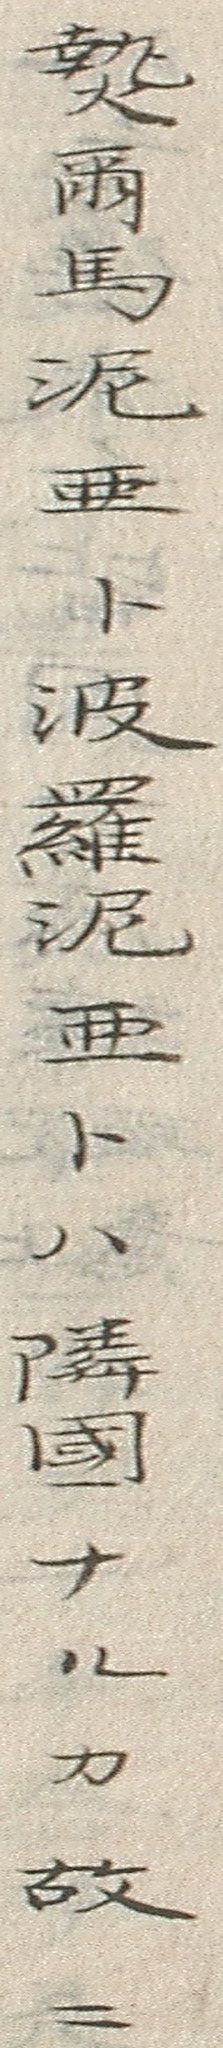熱爾馬泥亜ト波羅泥亜トハ隣国ナルカ故ニ
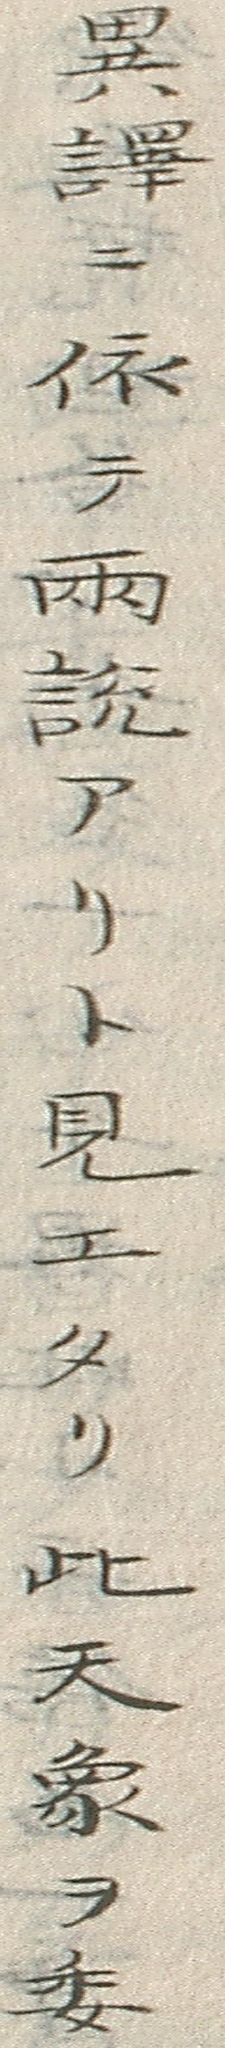異訳ニ依テ両説アリト見エタリ此天象ヲ委
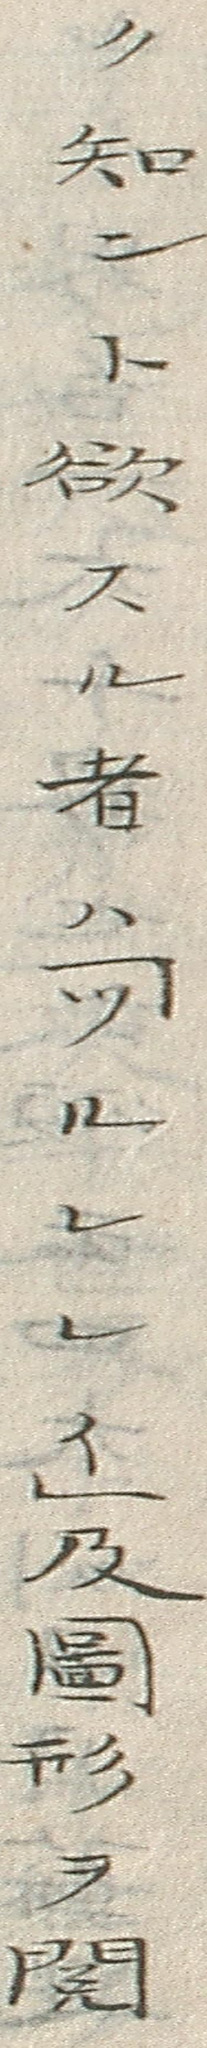ク知ント欲スル者ハ「ツルレレイ」及図形ヲ閲
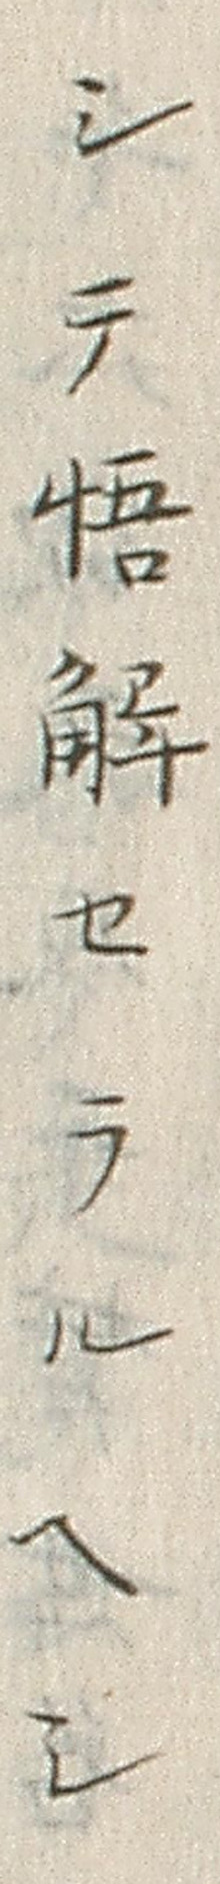シテ悟解セラルヘシ
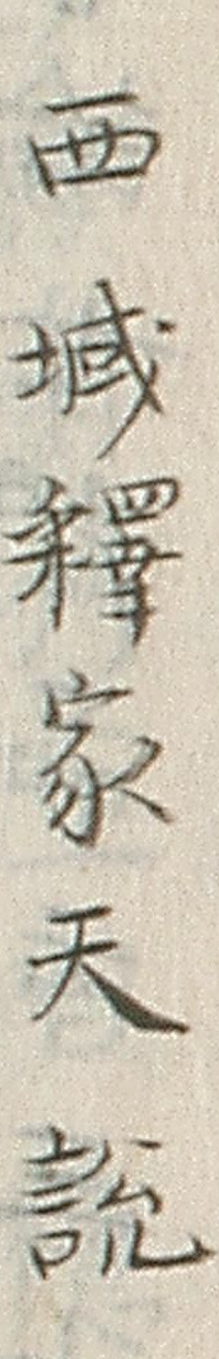西域釈家天説

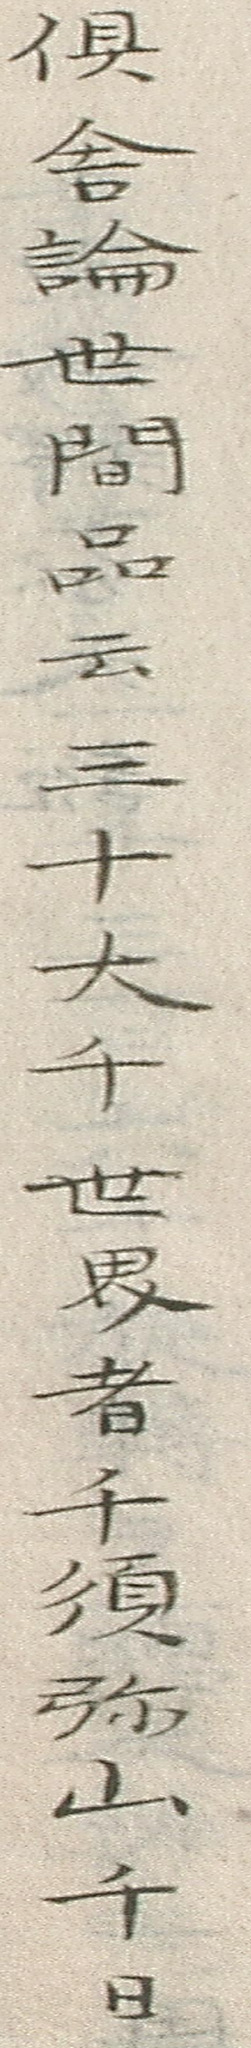俱舎論世間品云三十大千世界者千須弥山千日
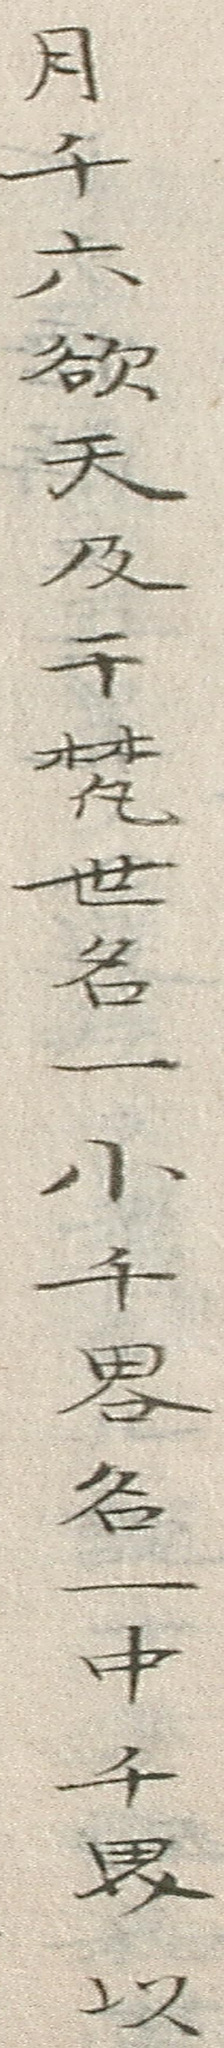月千六欲天及千梵世名一小千界名一中千界以
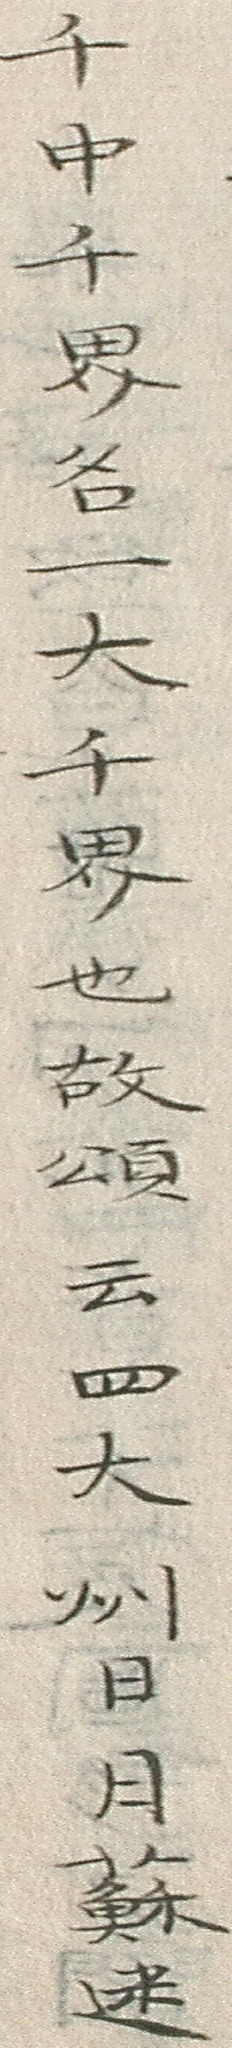千中千界名一大千界也故頌云四大州日月蘇迷
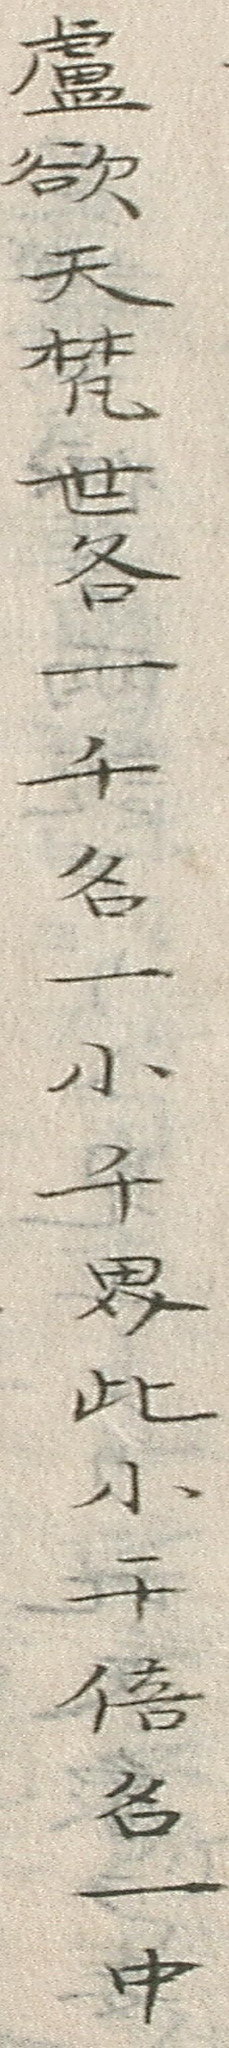盧欲天梵世各一千名一小千界此小千倍名一中
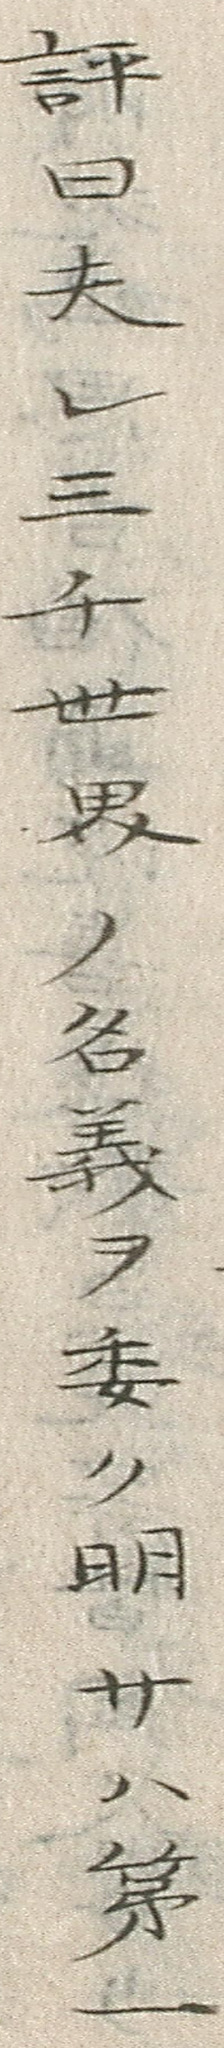評曰夫レ三千世界ノ名義ヲ委ク明サハ第一
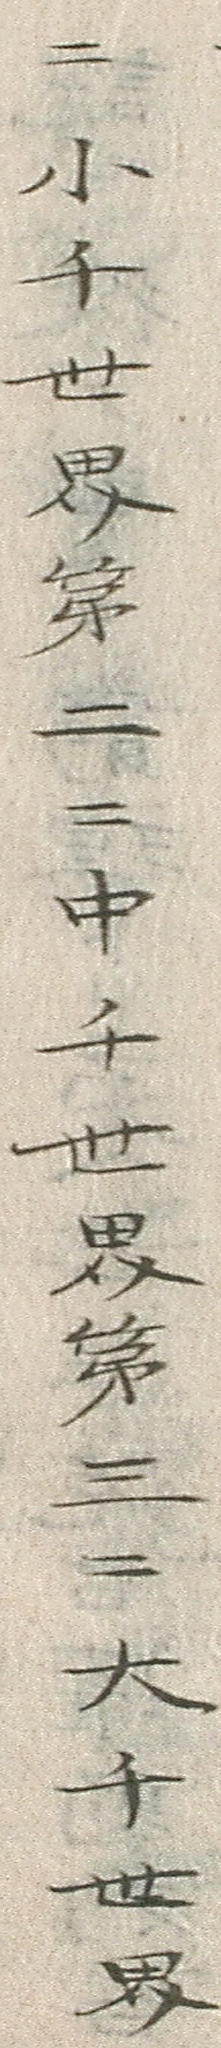ニ小千世界第二ニ中千世界第三ニ大千世界
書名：天學略名目羽翼　全
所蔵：東京大学地震研究所図書室 Earthquake Research Institute Library, The University of Tokyo, JAPAN
